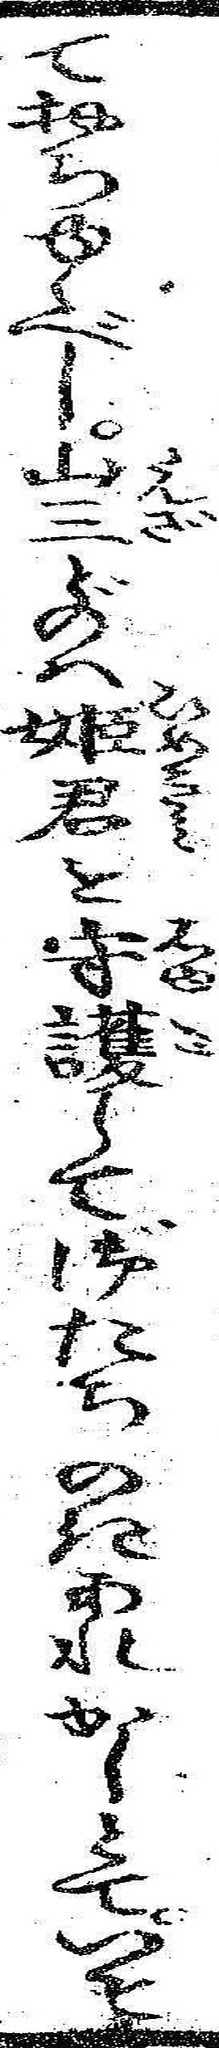ておちゆくべし。山三どのは姫君を守護して御たちのきあれかしとて。いそ
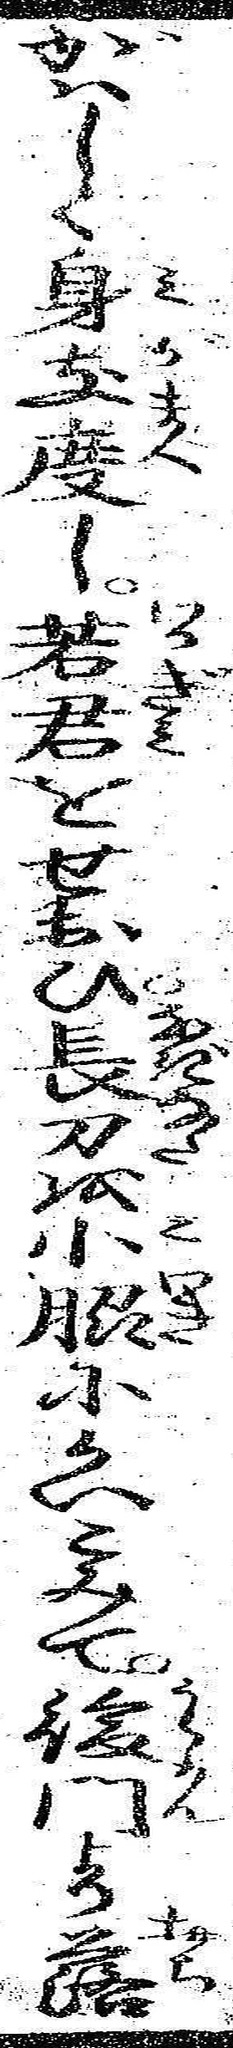がはしく身支度し。若君をせおひ。長刀を小脇にかいこみて。後門より落
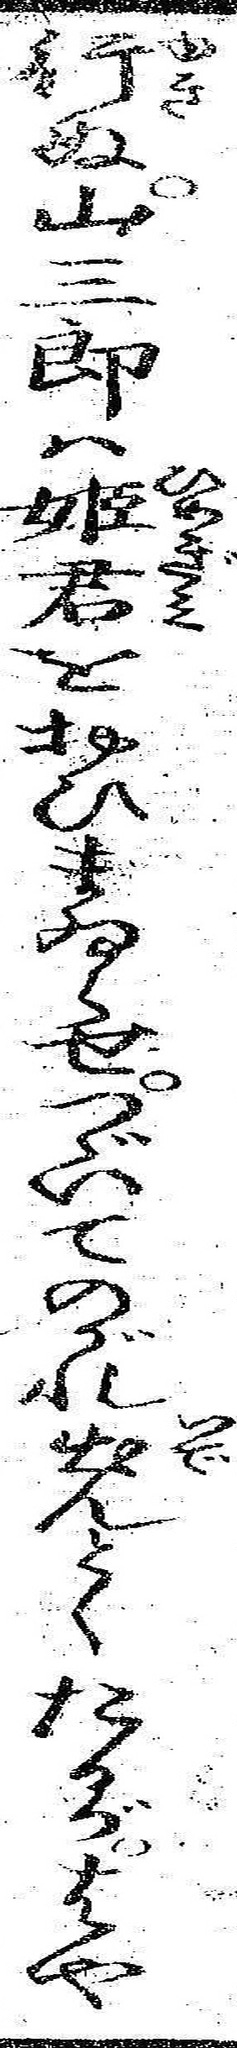行ぬ。山三郎は姫君をおひまゐらせ。つゞいてのがれ出んとしたるが。はや
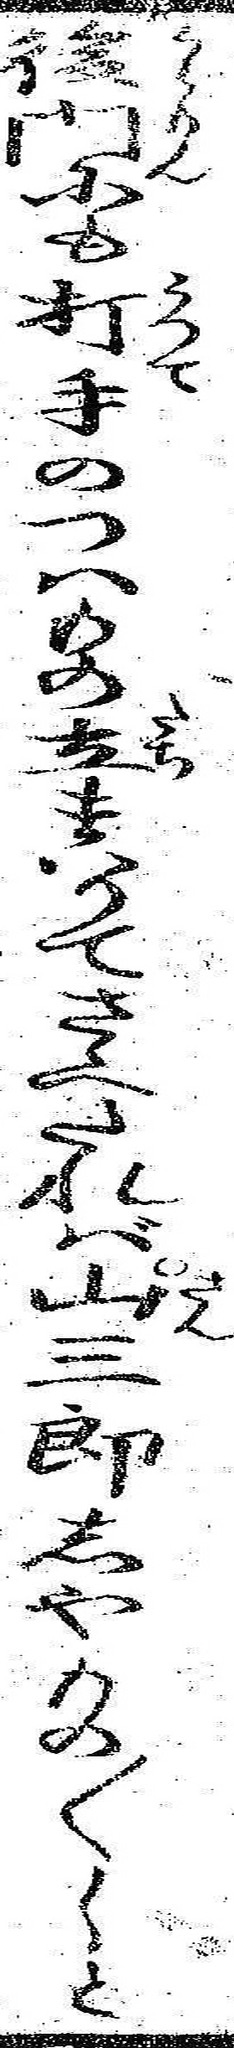後門にも打手のつはもの立まはりてさゝへたれば。山三郎しやもの〳〵しと
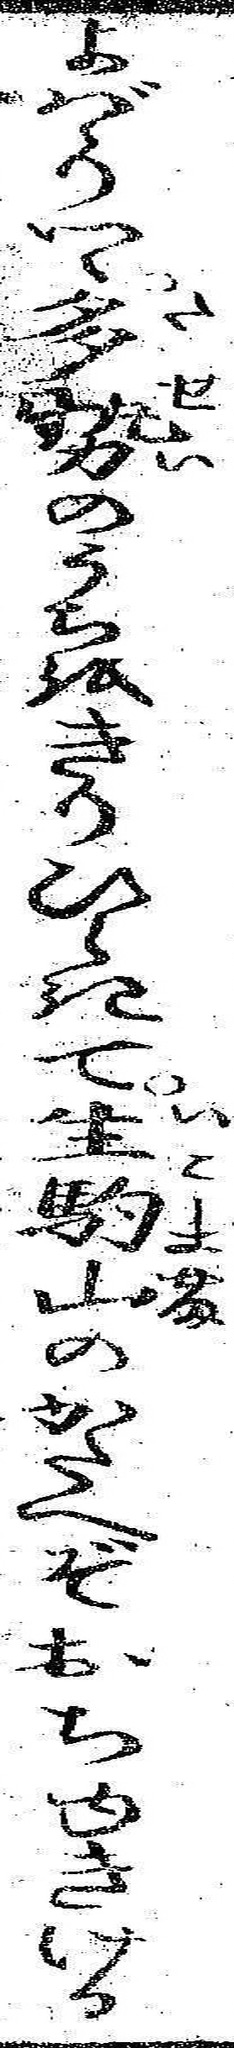よばゝりつゝ。多勢のうちをきりひらきて。生駒山のかたへぞおちゆきける
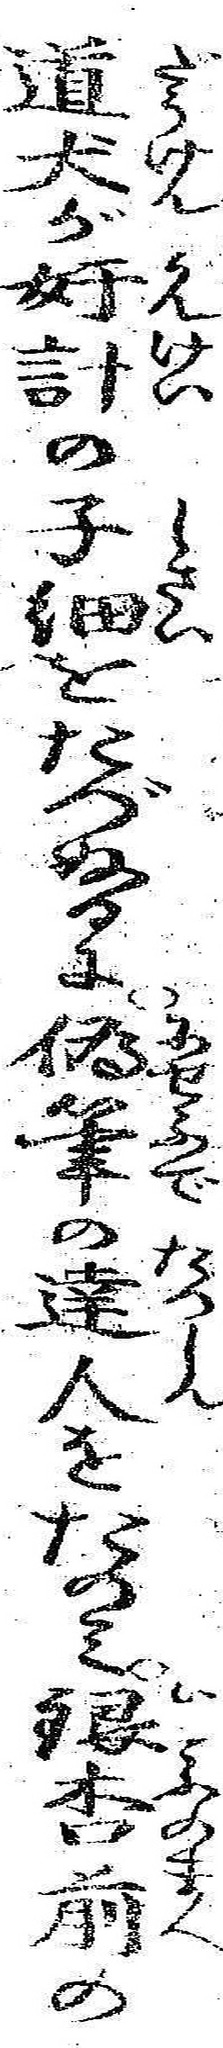道犬が奸計の子細をたづぬるに。偽筆の達人をたのみ。銀杏前の
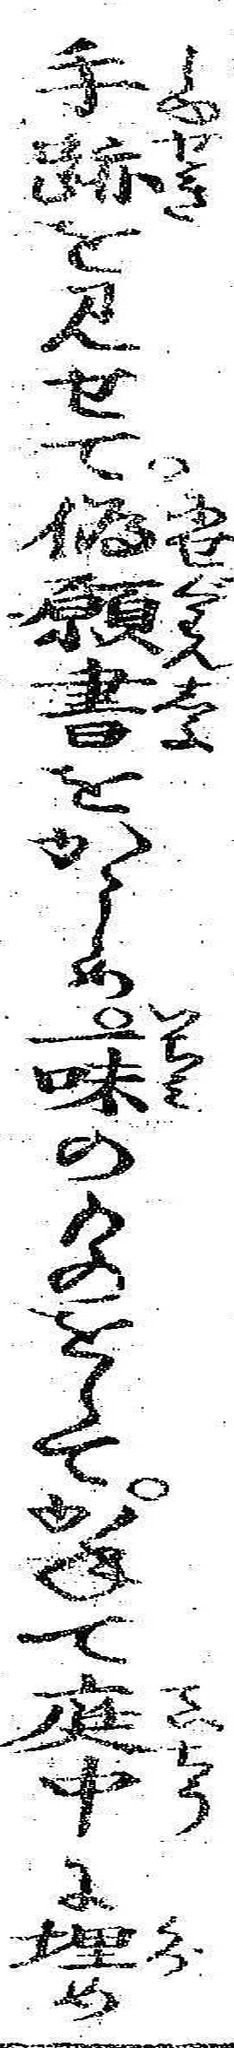手跡を見せて。偽願書をかゝしめ一味のものをして。かねて庭中に埋め
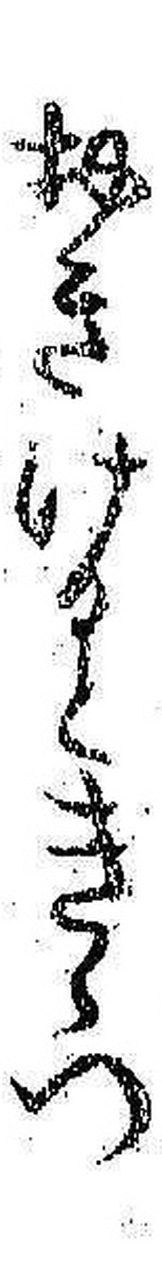おきけるときゝつ
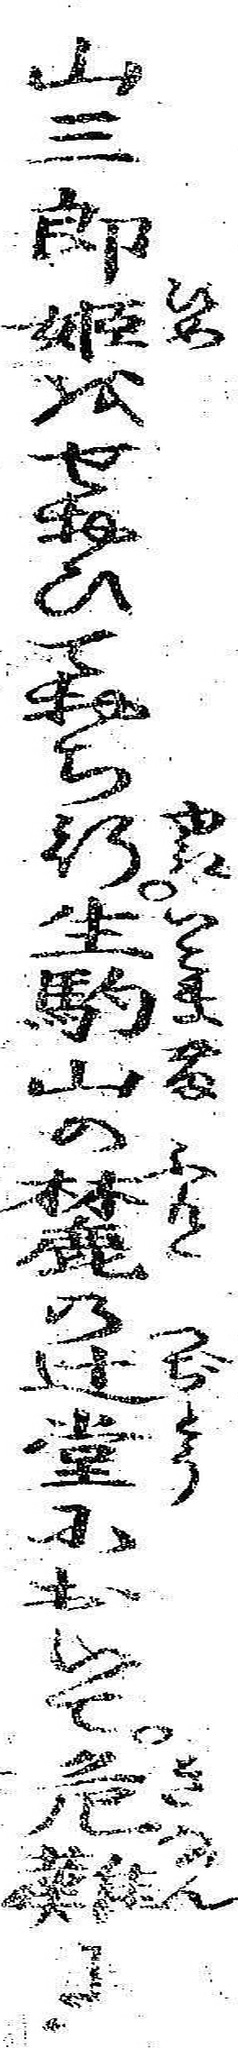山三郎姫をせおひておち行。生駒山の麓の辻堂において。危難に
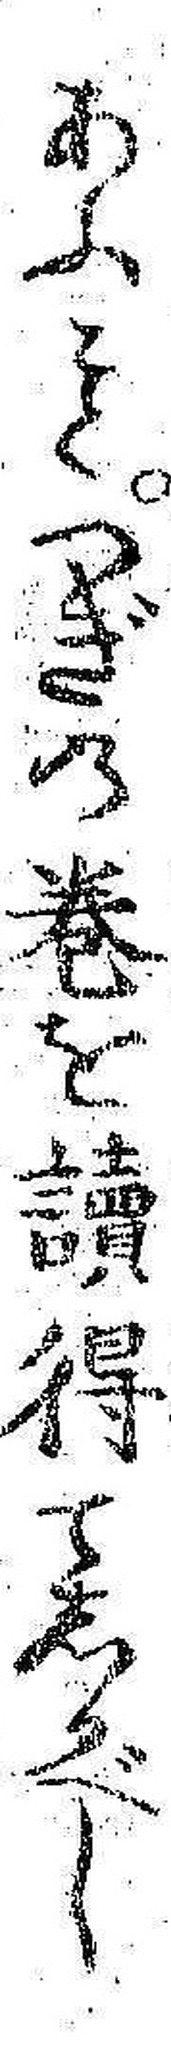あふこと。つぎの巻を読得てしるべし
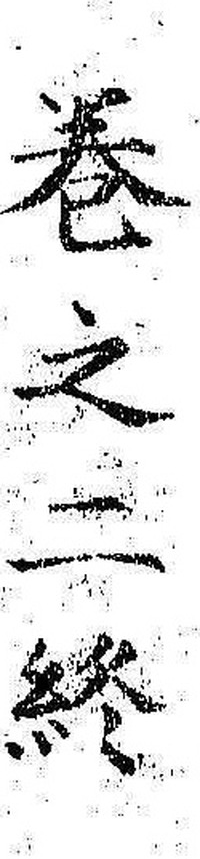巻之二終

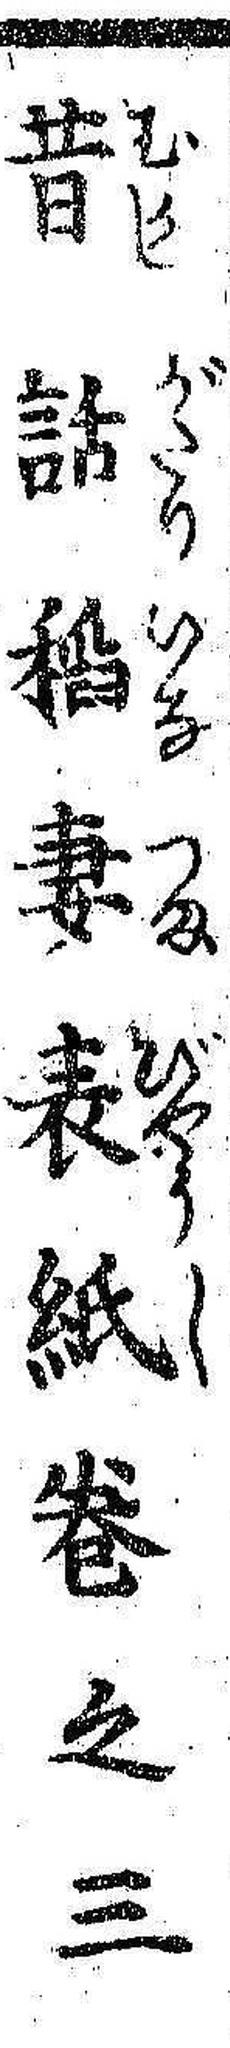昔話稲妻表紙巻之三
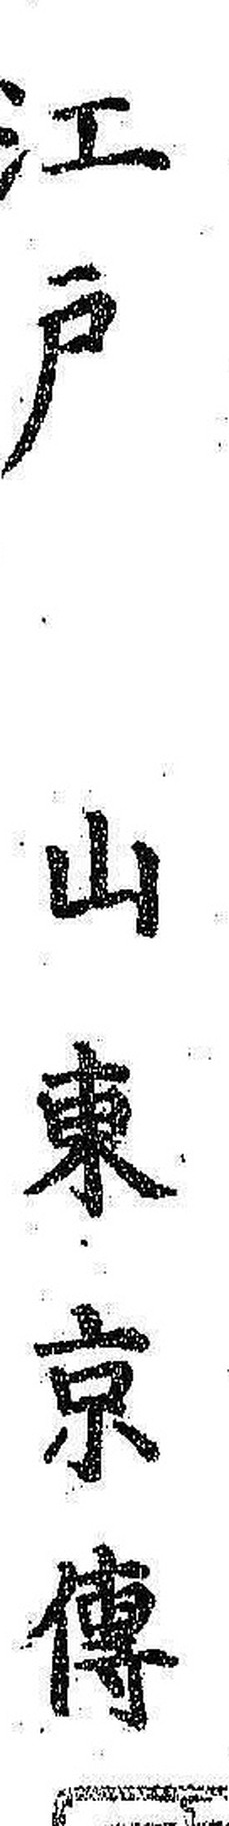江戸山東京伝編
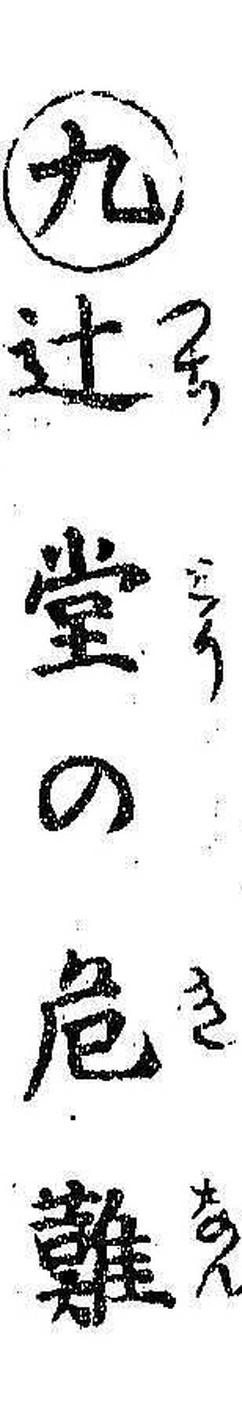九辻堂の危難
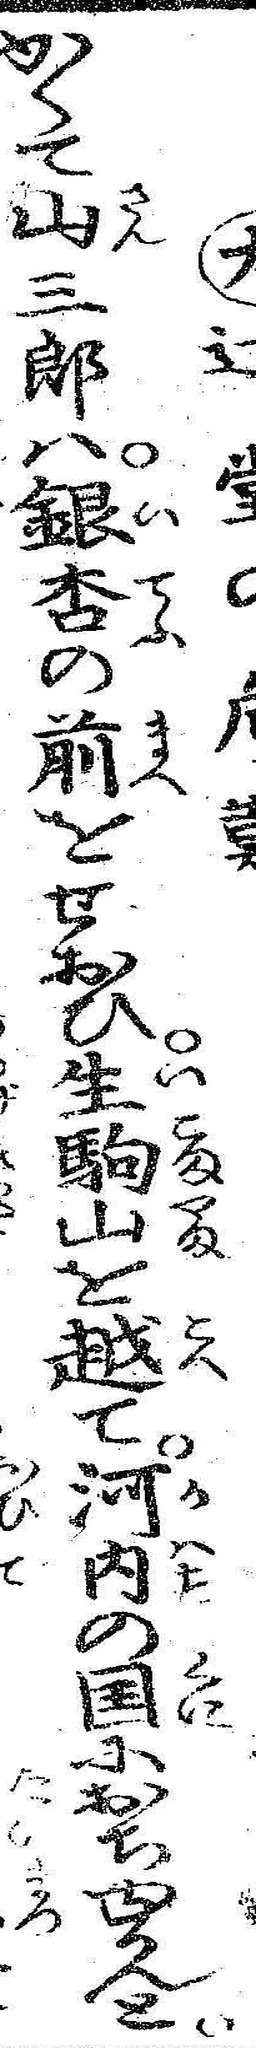かくて山三郎は。銀杏の前をせおひ。生駒山を越て。河内の国におちゆかんと。
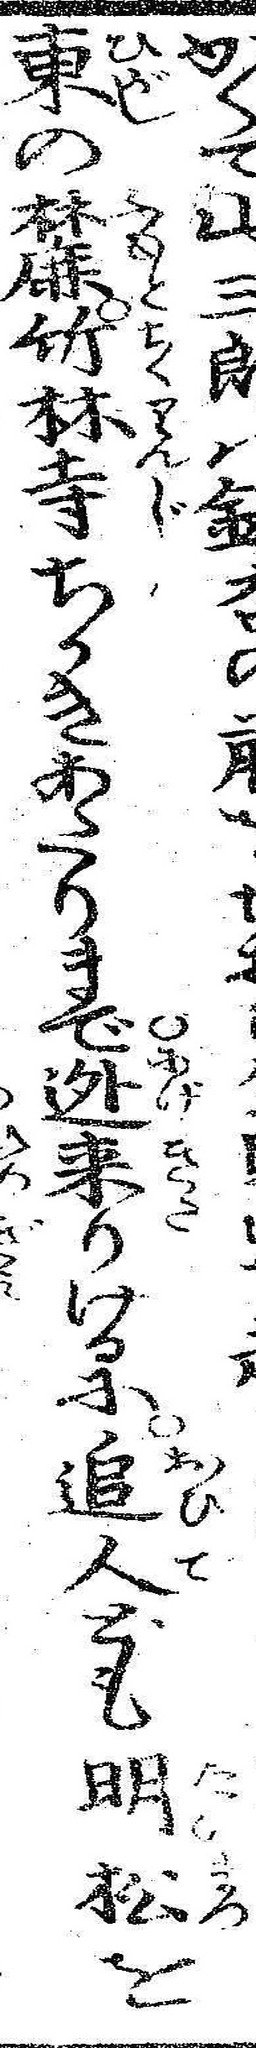東の麓。竹林寺ちかきあたりまで。逃来りけるに。追人ども明松を
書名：昔話稲妻表紙
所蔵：国文学研究資料館
